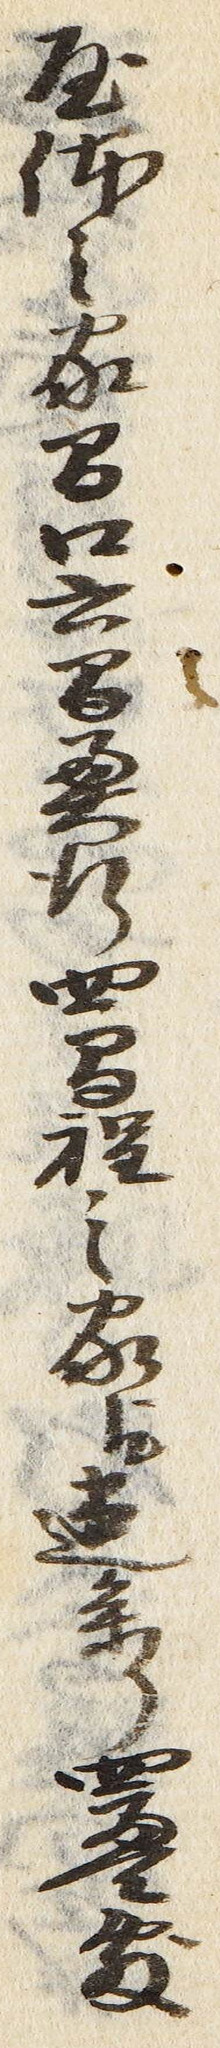屋体之家間口六間奥行四間程之家江連参り四畳敷
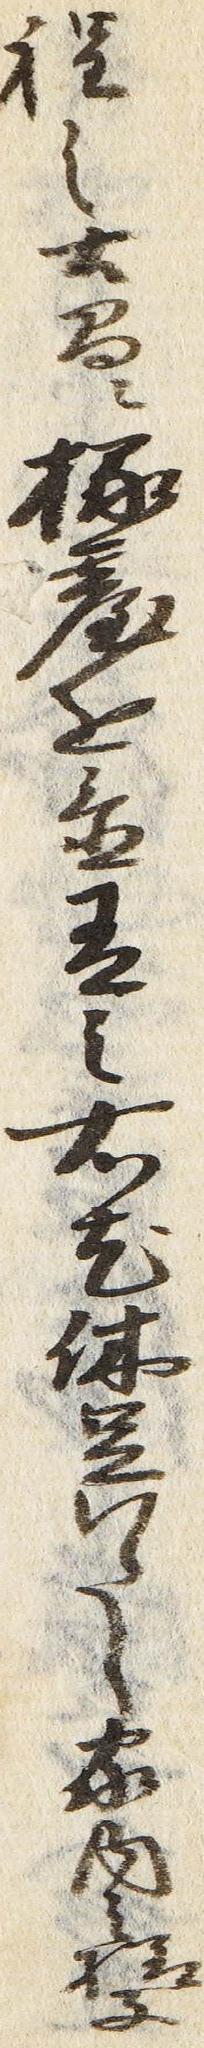程之土間ニ椽臺を置有之右尤休足いたし家内之様子
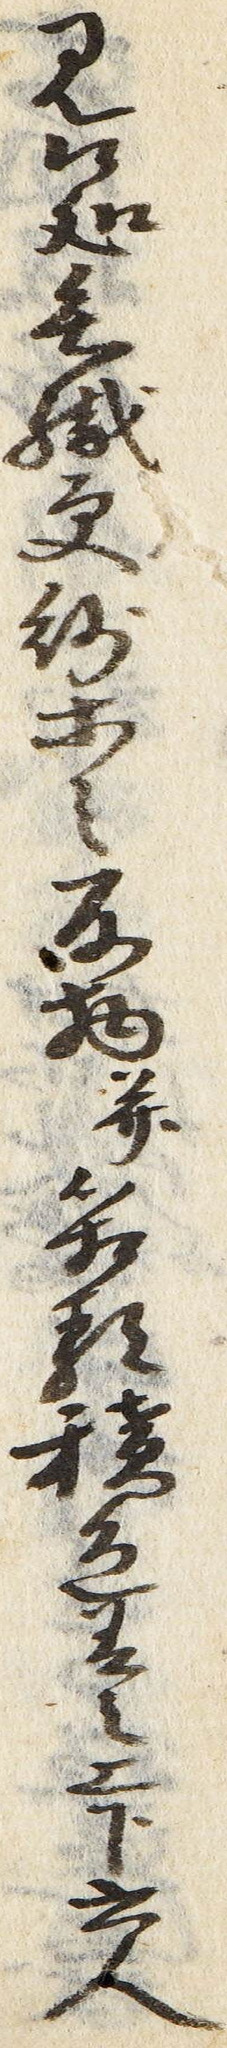見候処毛織更紗等之反物幷箱類積有之上下六人
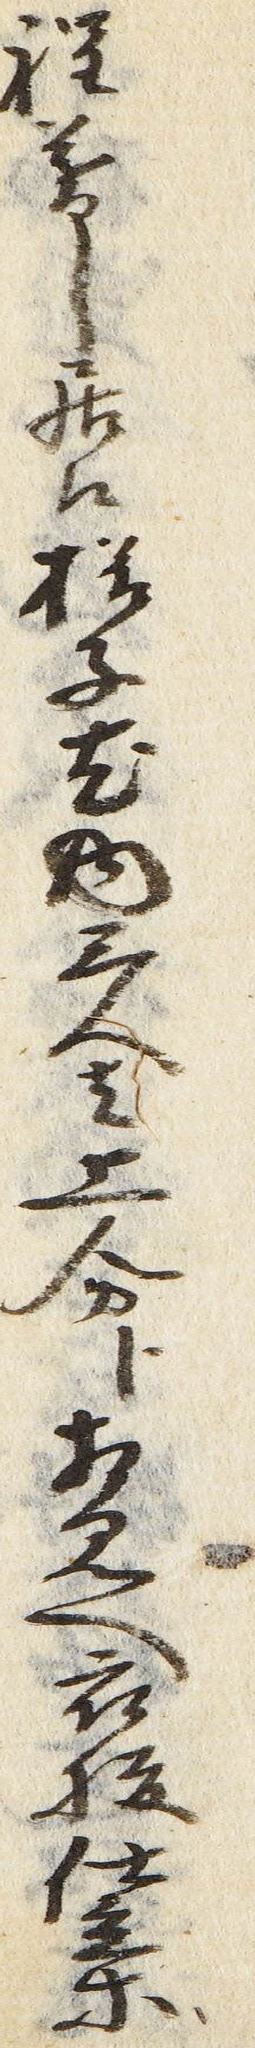程暮し居候様子尤内三人者上分ト相見へ衣服仕立等
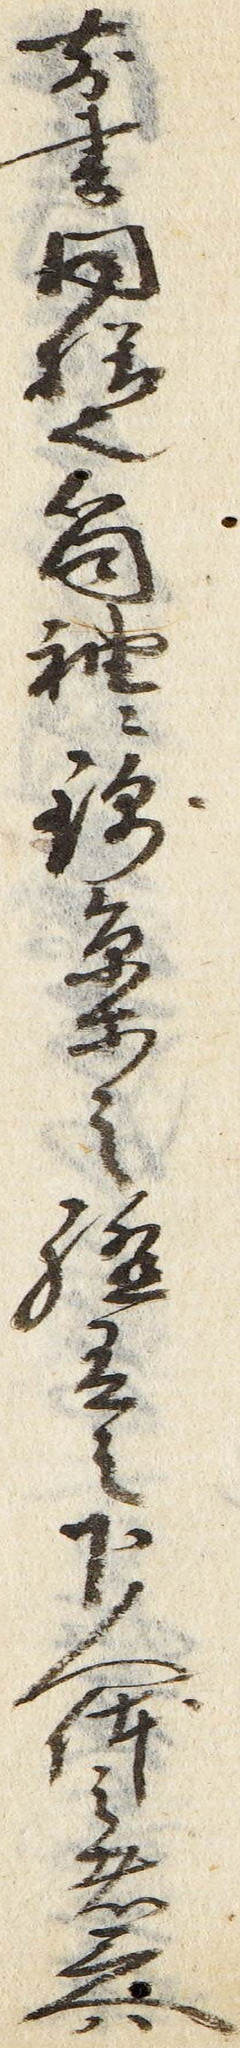前書同様也筒袖ニ錦糸等之縫有下人体之者三人ハ

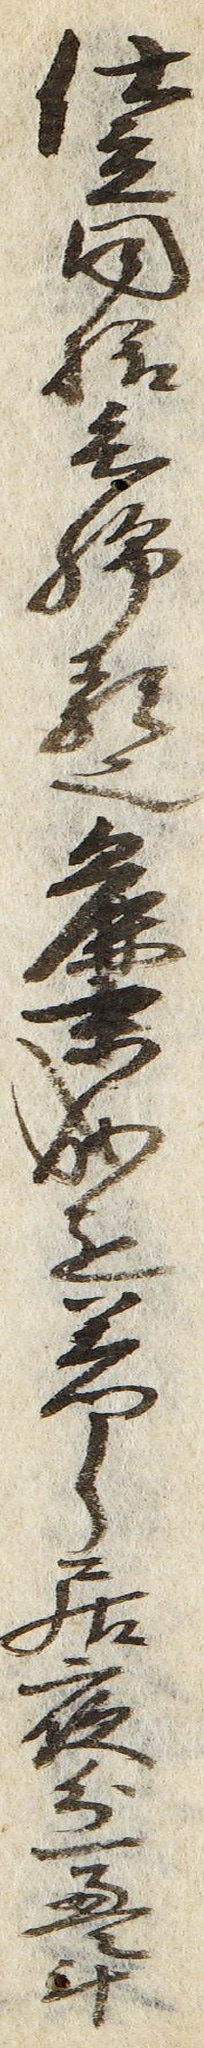仕立同様毛綿類也麁末成を着し居夜分一畳斗
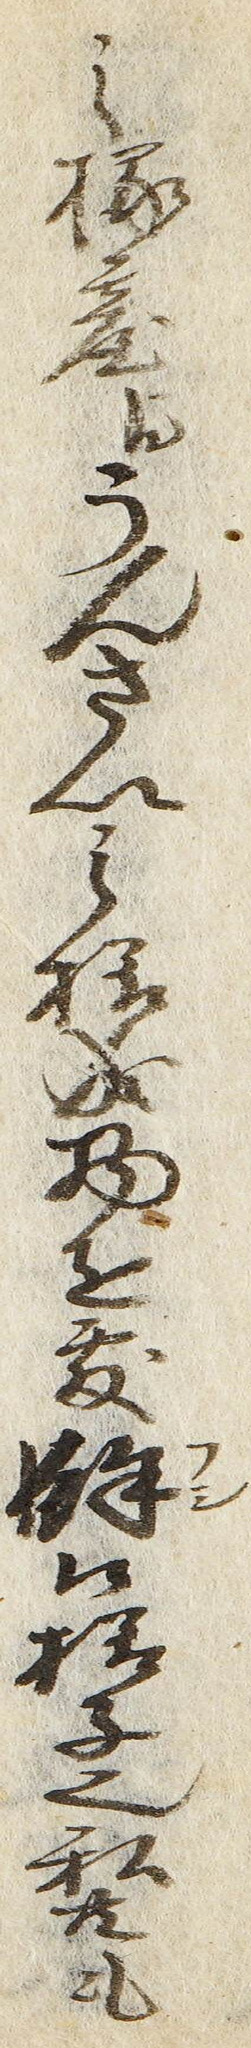之縁臺江うんさい之様成物を敷餘候様子也私共も
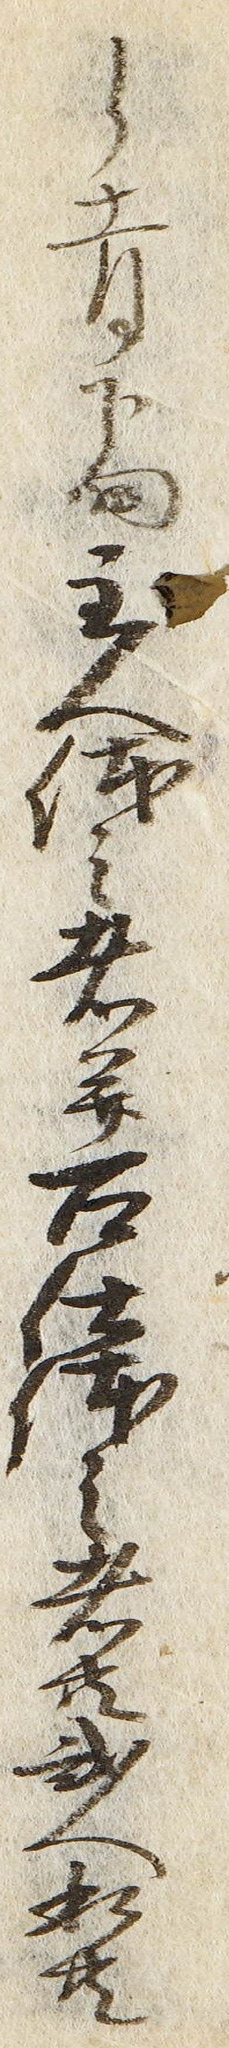し十一月下旬主人体之者幷召仕体之者共弐人私共
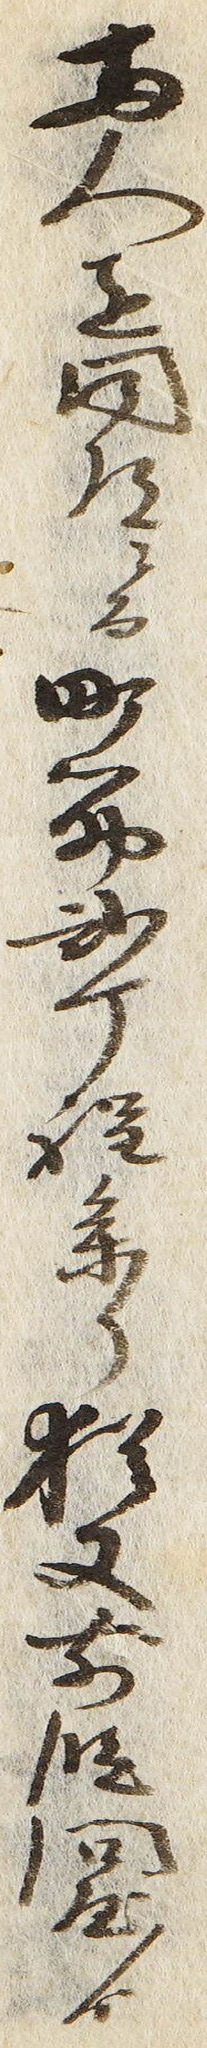両人を同道ニ而町筋弐丁程参り猶又前段問屋ゟ
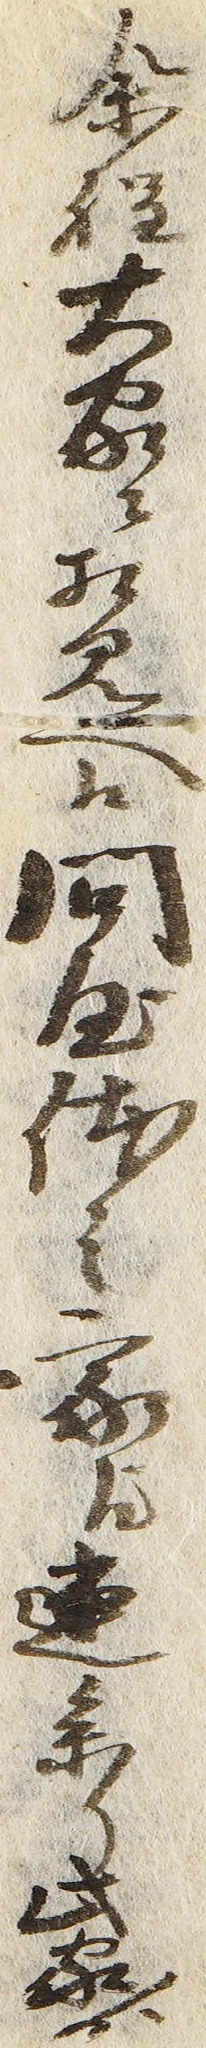余程大屋ニ相見へ候問屋体之家江連参り此家ゟ
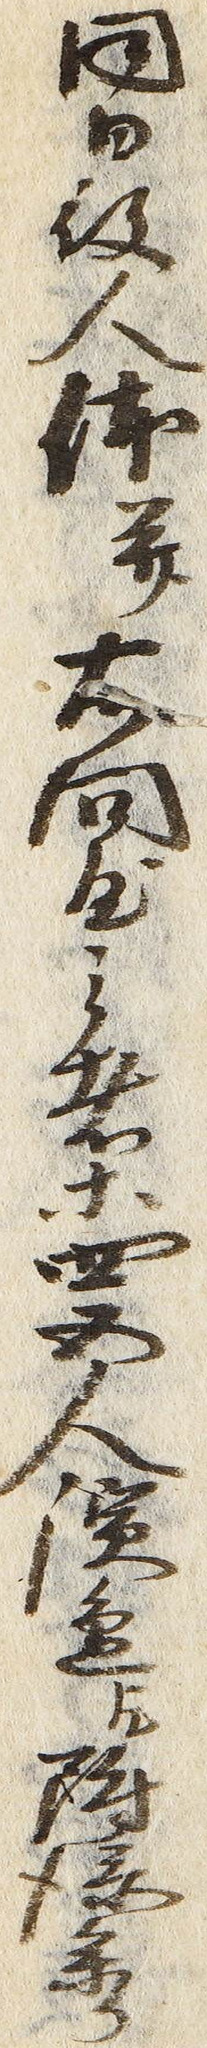同日役人体幷右問屋之者等四五人濱邊江附添参り
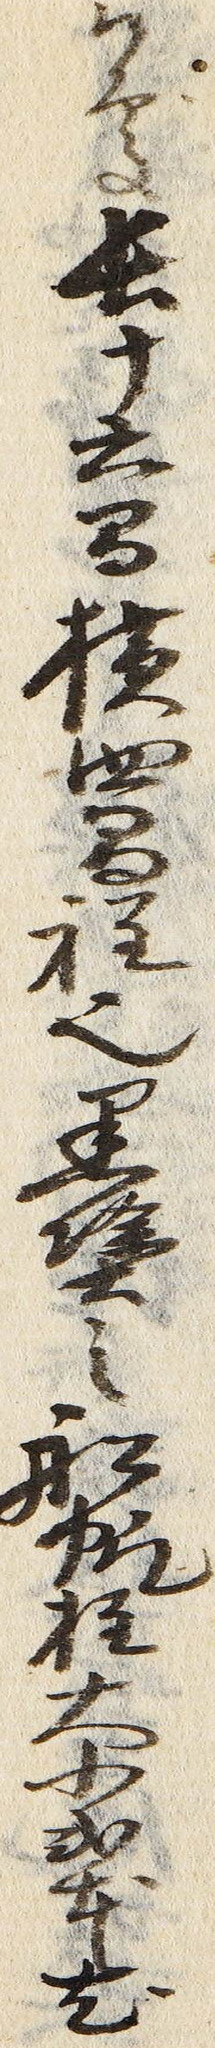候處長十六間横四間程也黒塗之舩帆柱大小弐本尤
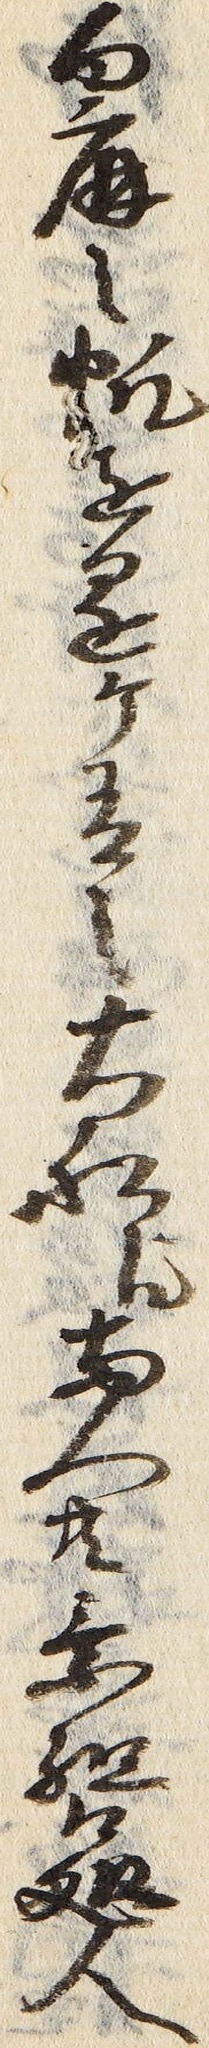白麻之帆を懸ケ有之右舩江両人共乗組候処人
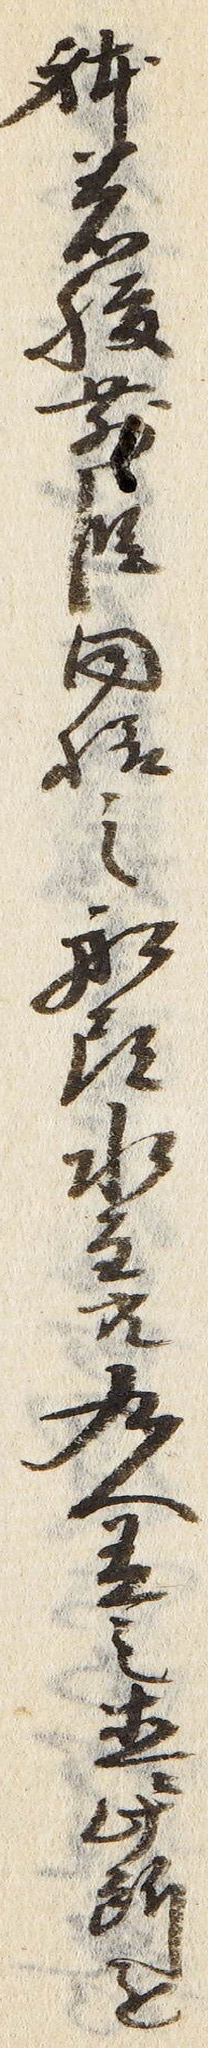躰着服前段同様之舩頭水主共九人有之直ニ此所を
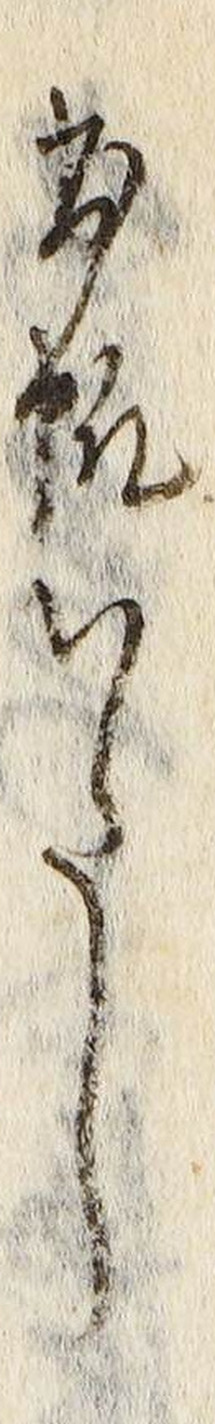出帆いたし
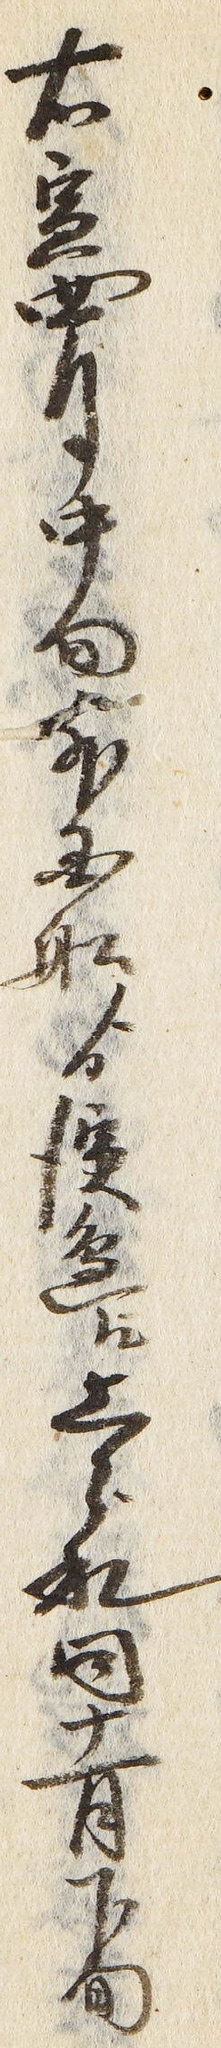右寅四月中旬外国舩ゟ濱邊江上られ同十一月下旬
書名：漂流人善助聞書
